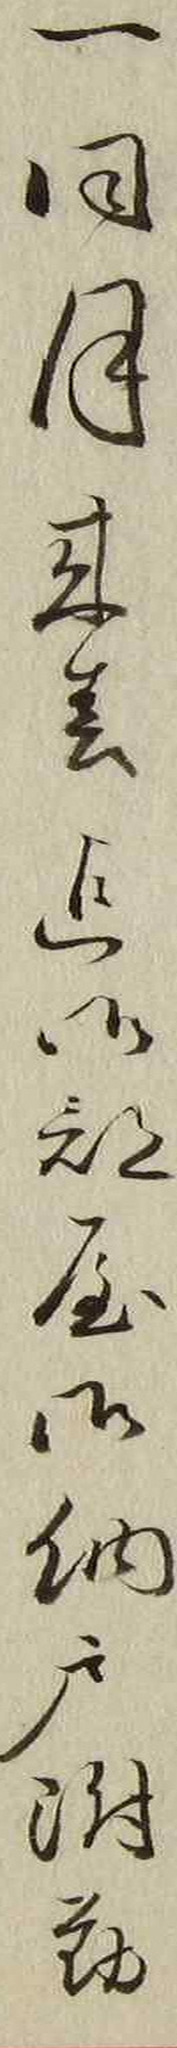一同月来春迄御部屋御納戸附勤
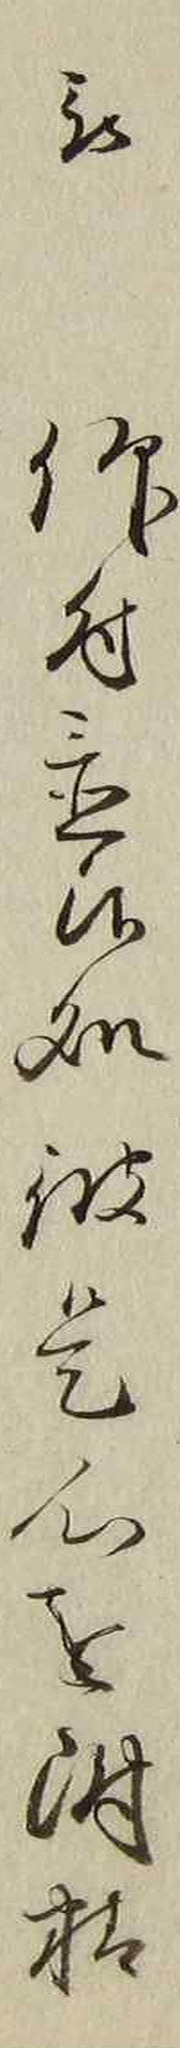被仰付置候処彼是心を附精
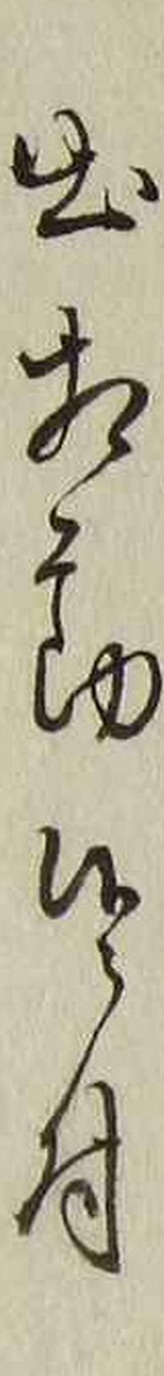出相勤候ニ付
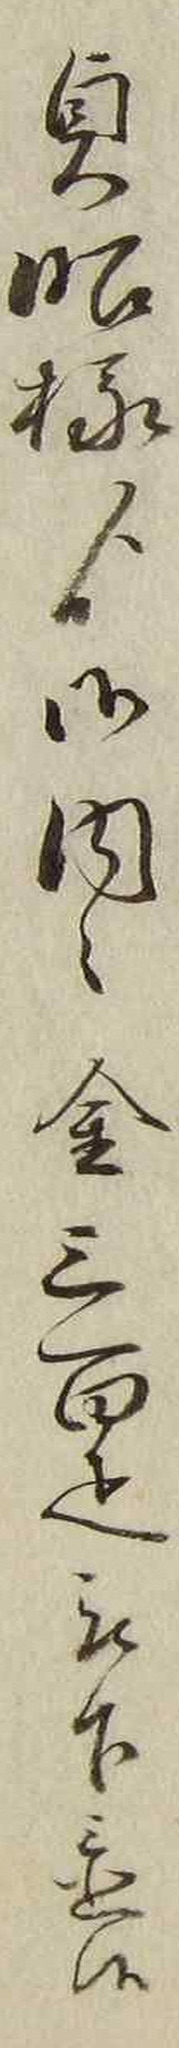貞昭様ゟ御内々金三百疋被下置候

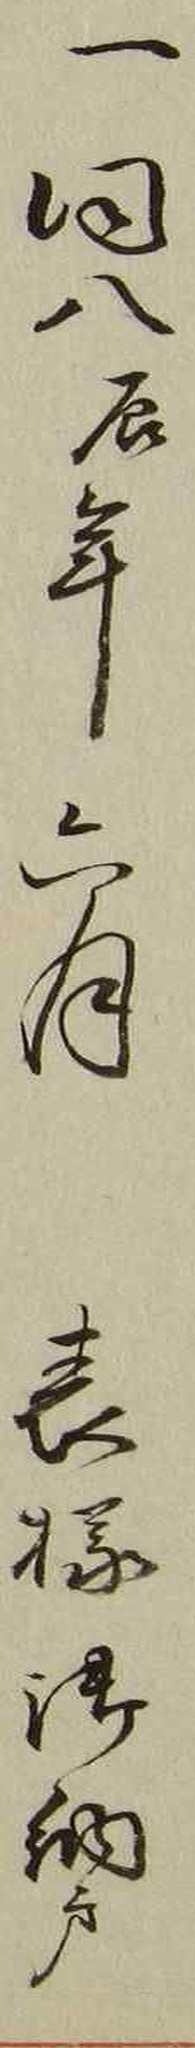一同八辰年六月表様御納戸
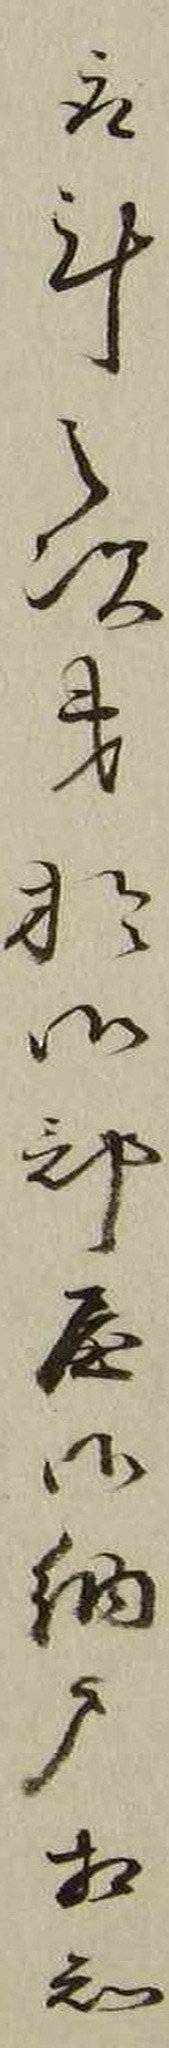取計之次第於御部屋御納戸相知
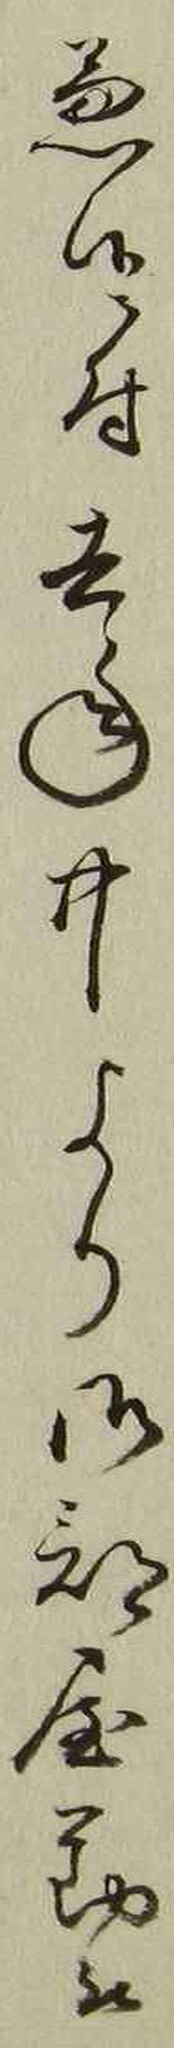兼候ニ付去年中より御部屋勤被
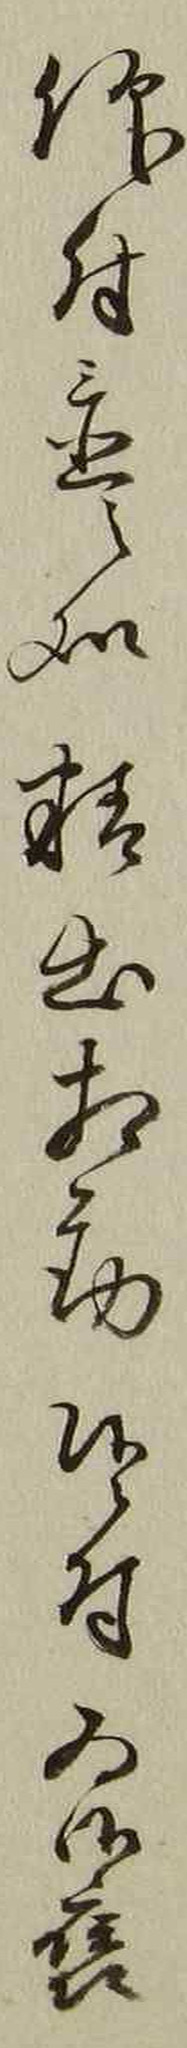仰付置候処精出相勤候ニ付為御褒
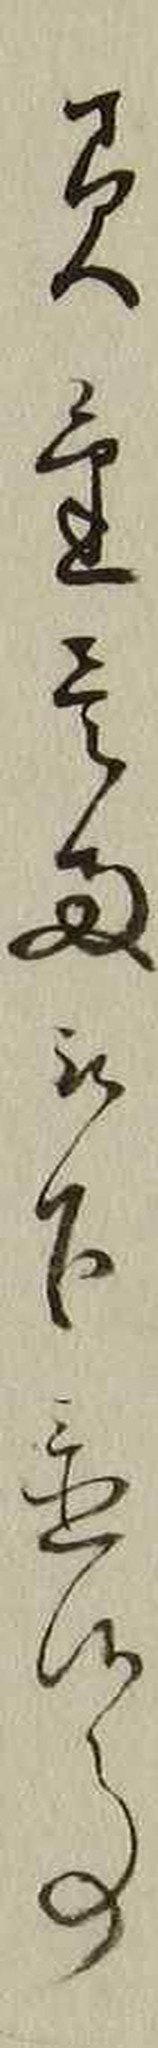美金壱両被下置候事
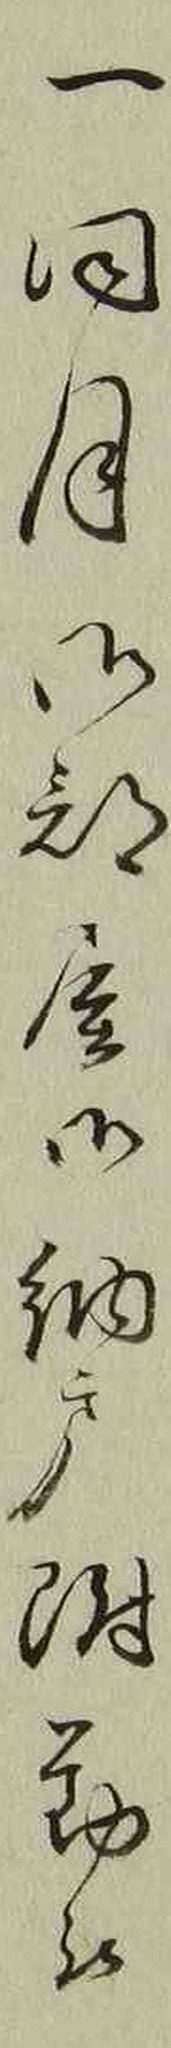一同月御部屋御納戸附勤被
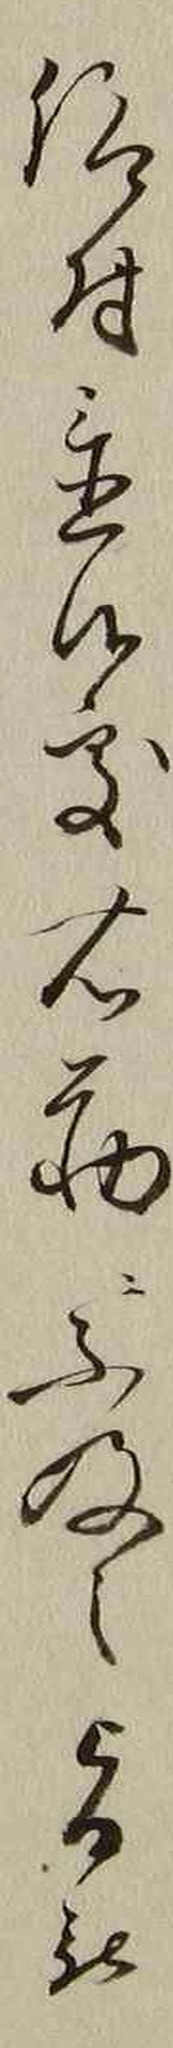仰付置候処右勤ニ不及之旨被
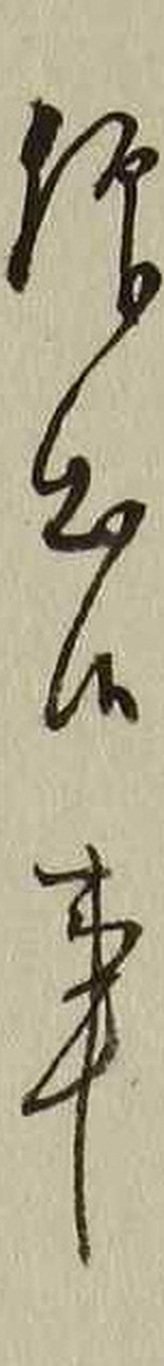仰出候事
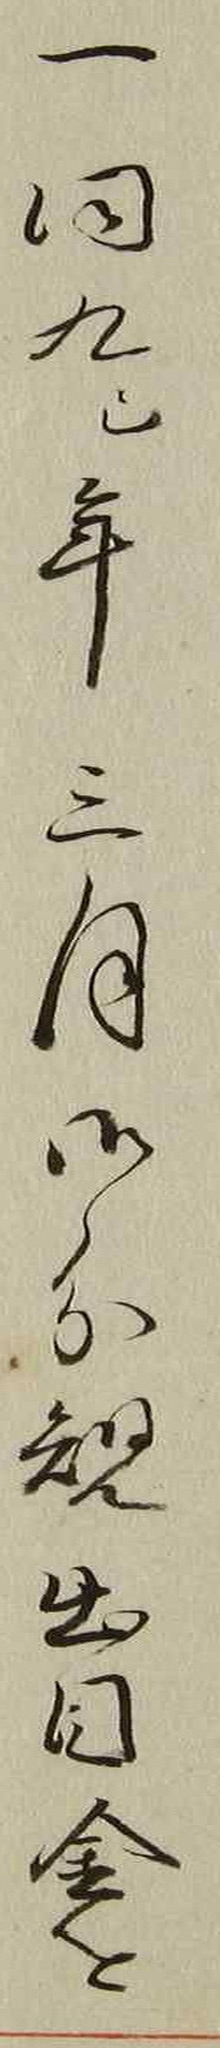一同九巳年三月御分規出目金を
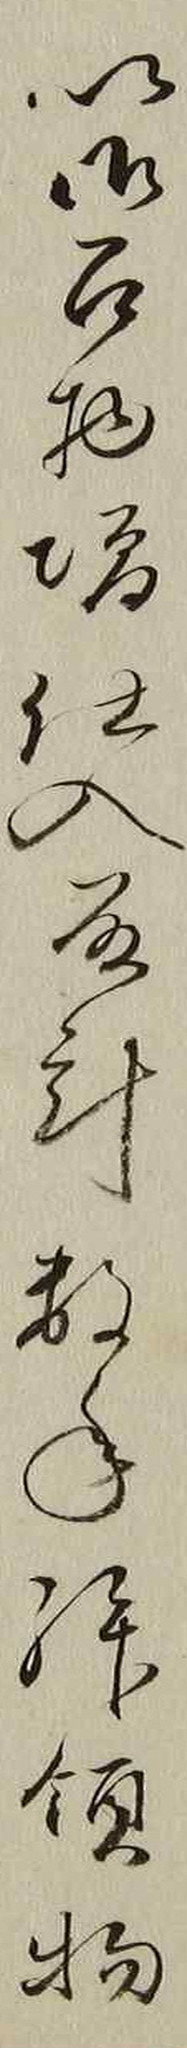以御召物増仕入取計数年拝領物
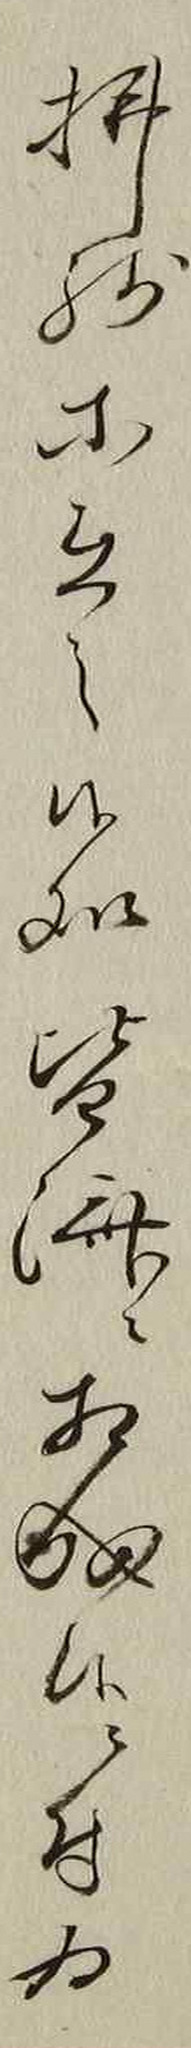払残等在之候処皆済ニ相成候ニ付為
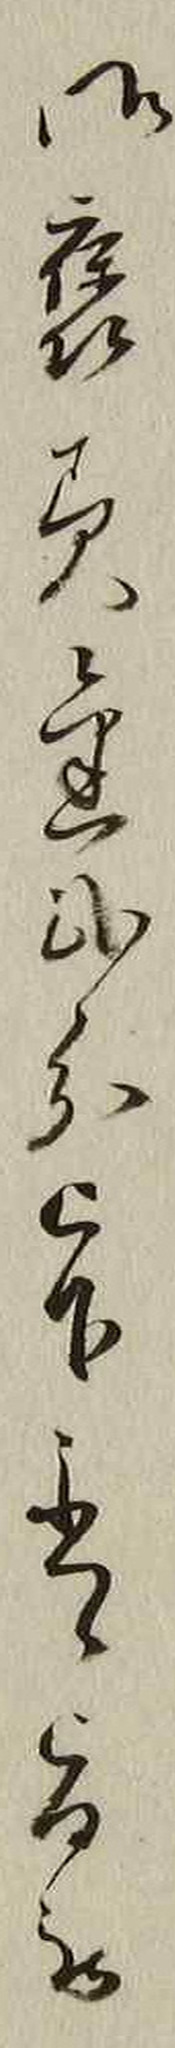御褒美金弐分被下置候旨被
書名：諸士系譜　巻之4　い之部4
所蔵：会津若松市立会津図書館
